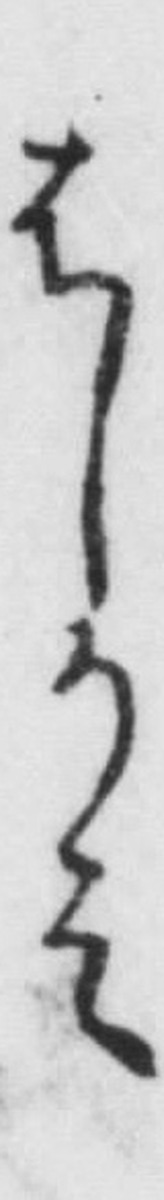はしかみ
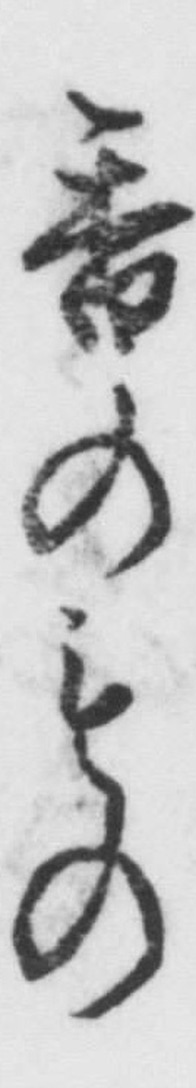香のもの
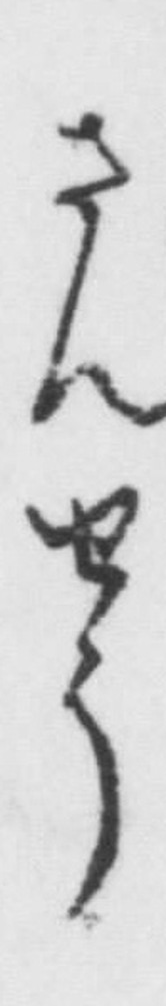さんせう
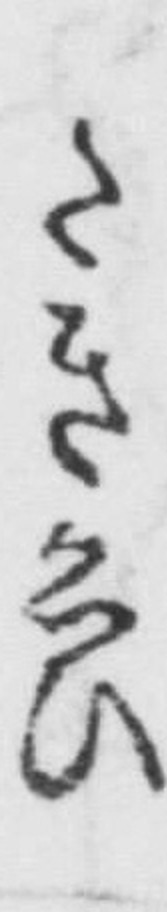たきゑひ
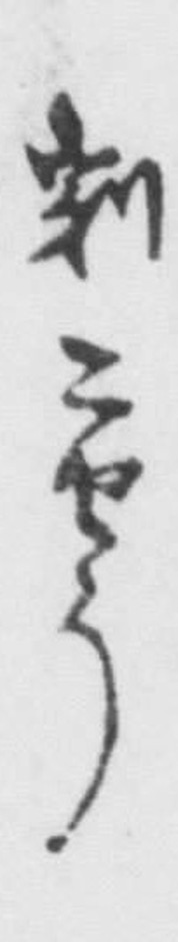割こせう

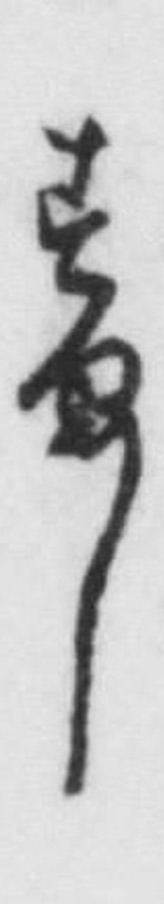すまし
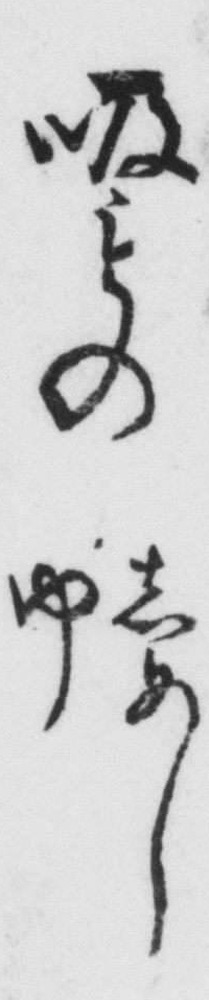吸物しめし
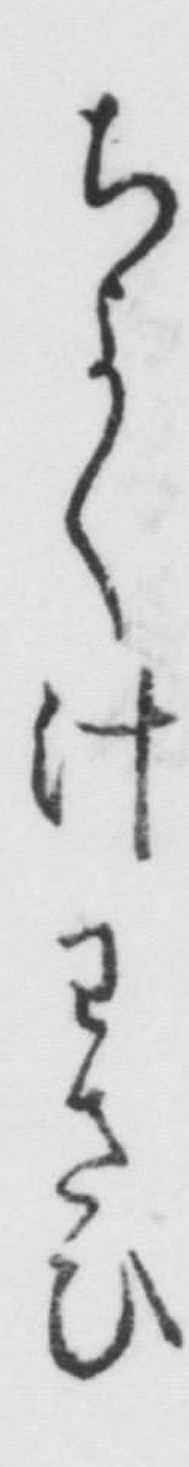ちよく汁わさひ
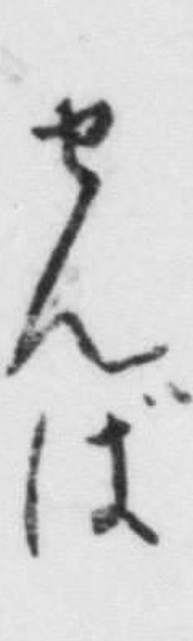せんば
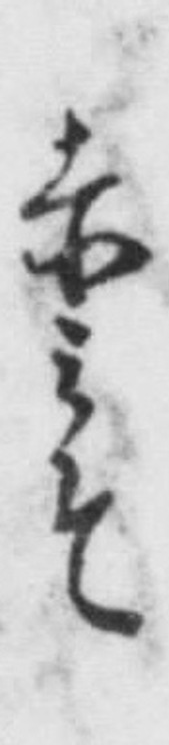赤みそ
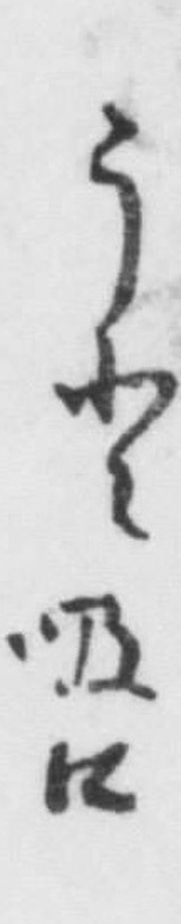うと吸口

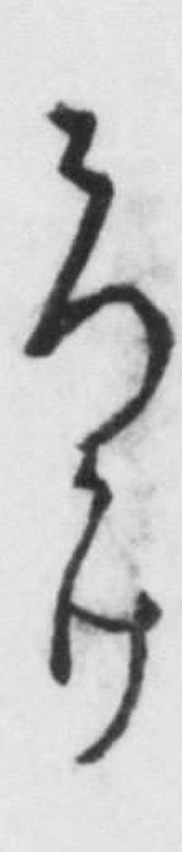みつかけ
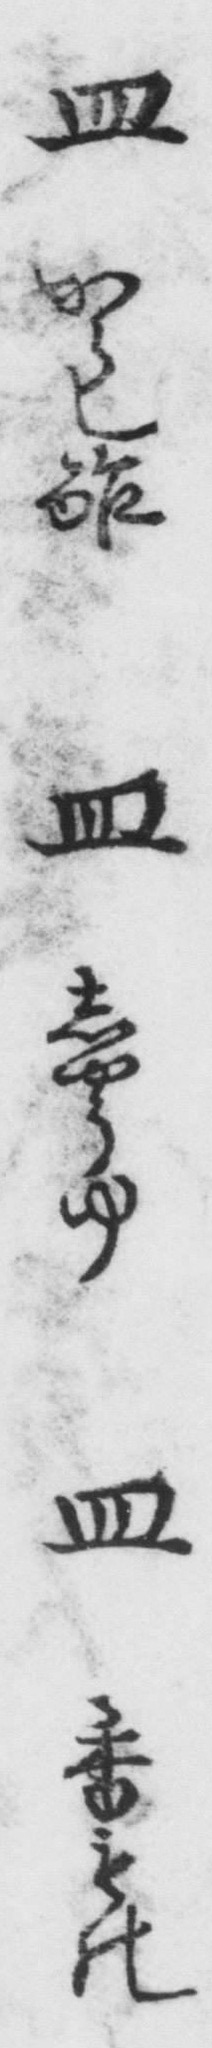皿からし酢皿しやうゆ皿香の物

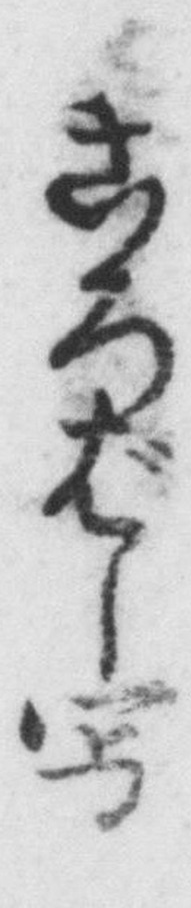ころばし写
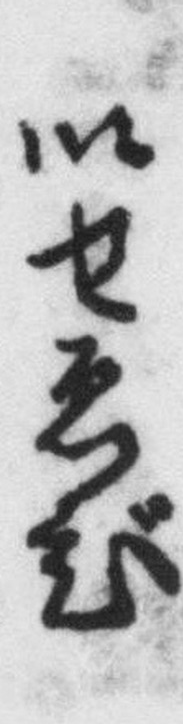いせゑひ
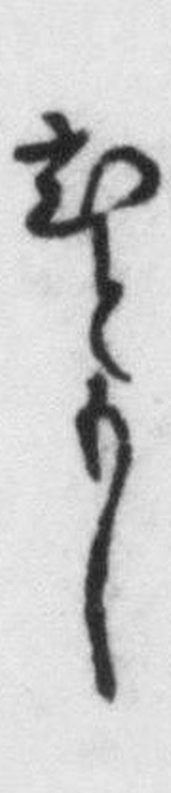ひともし
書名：卓子料理仕様
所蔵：大阪府立大学学術情報センター 国文学研究資料館
